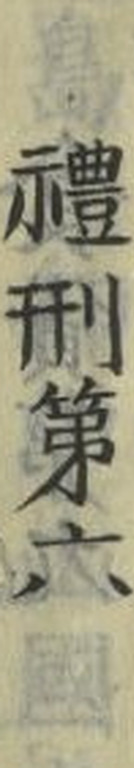禮刑第六
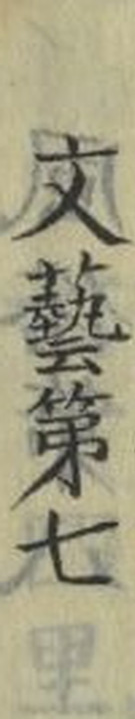文藝第七

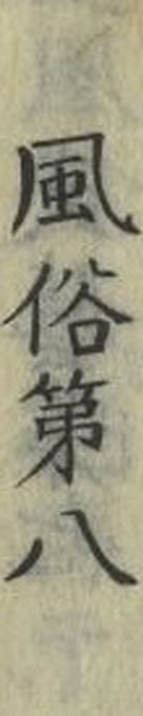風俗第八
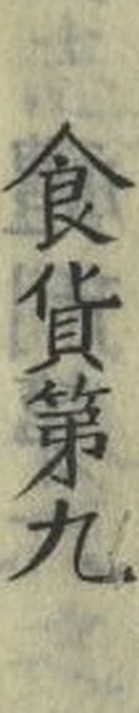食貨第九
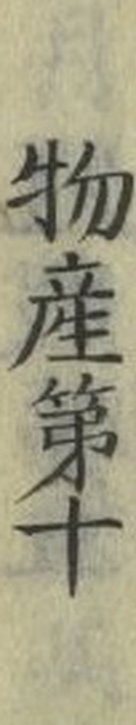物産第十
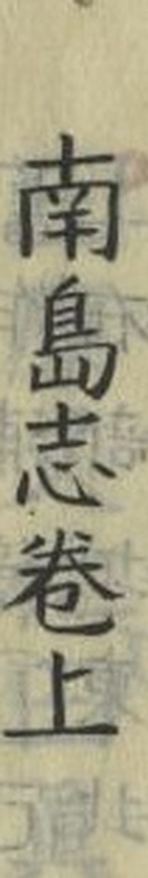南島志卷上
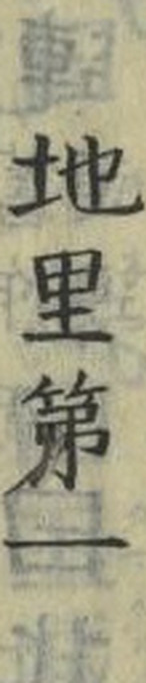地里第一
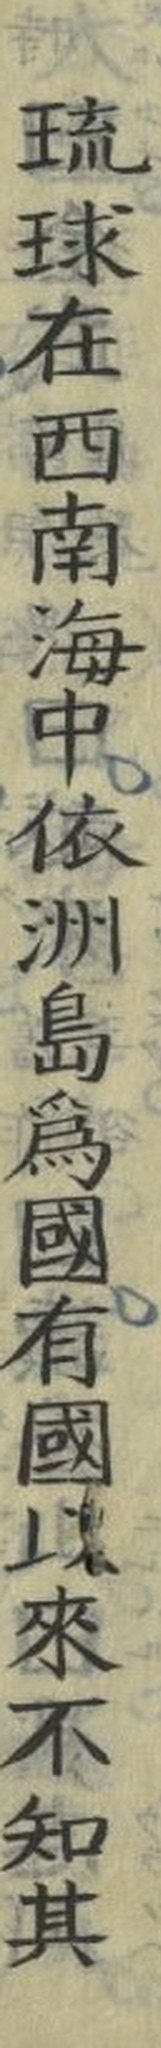琉球在西南海中。依洲島爲國。有國以來不知其
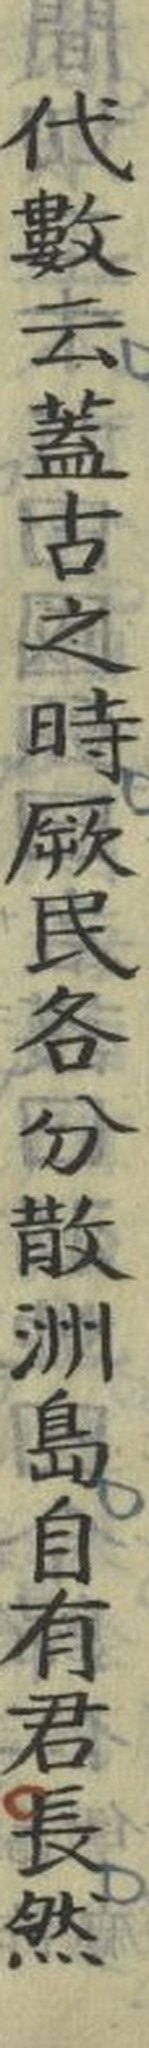代數云。蓋古之時。厥民各分散洲島。自有君長。然
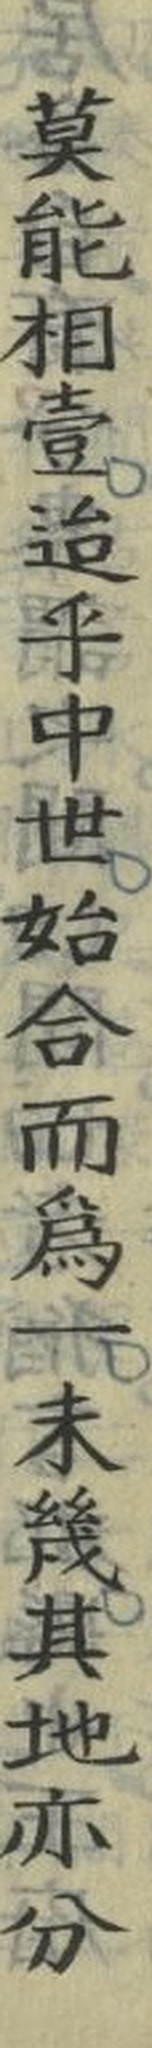莫能相壹。迨乎中世。始合而爲一。未幾。其地亦分
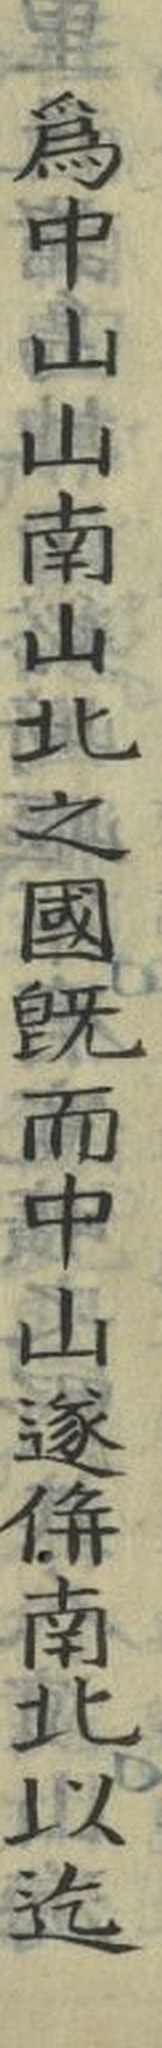爲中山山南山北之國。既而中山遂併南北。以迄
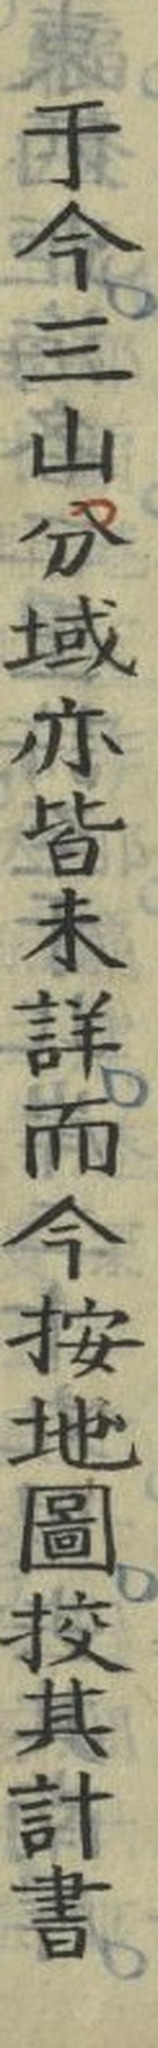于今。三山分域亦皆未詳。而今按地圖。挍其計書。
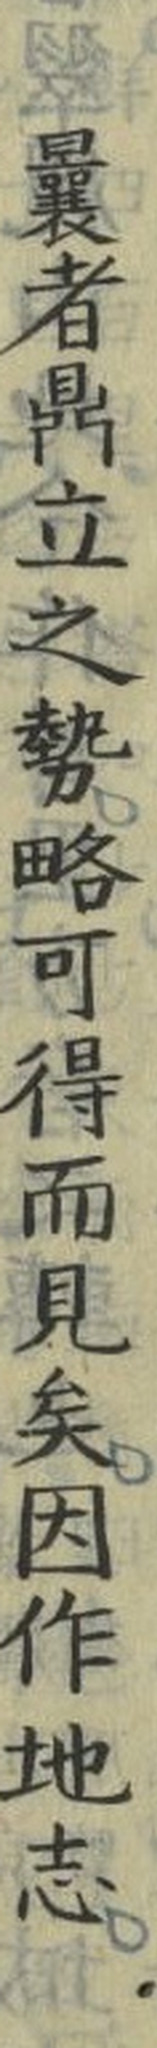曩者鼎立之勢。略可得而見矣。因作地志。
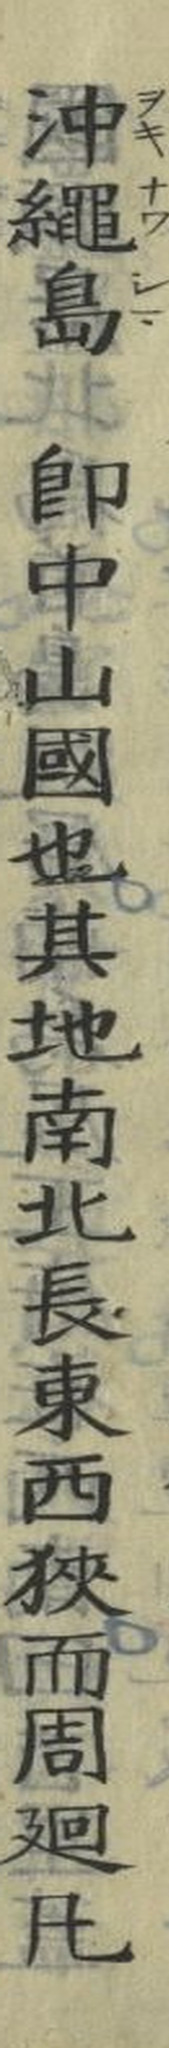沖繩島卽中山國也。其地南北長東西狹。而周廻凡

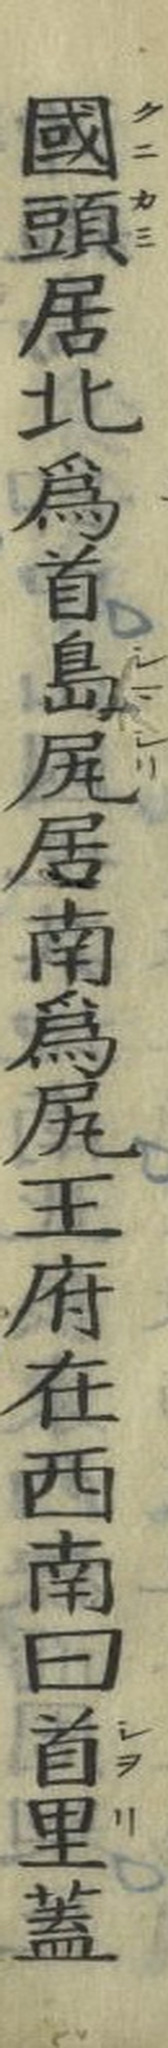國頭居北爲首。島尻居南爲尻。王府在西南曰首里。蓋
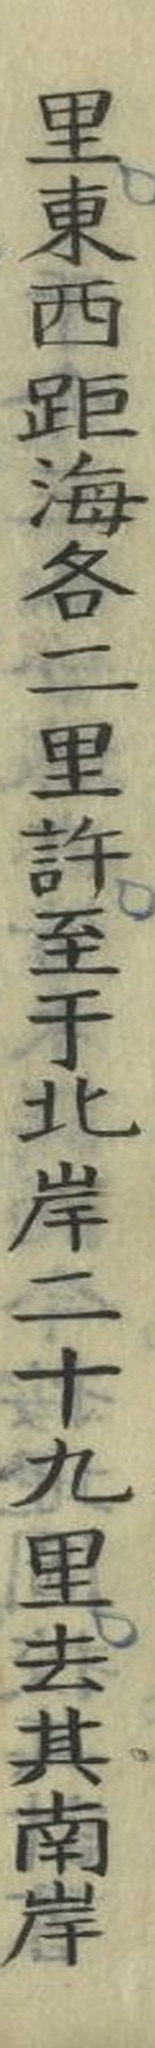里。東西距海各二里許。至于北岸二十九里。去其南岸
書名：南島志
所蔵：University of the Ryukyus Library
